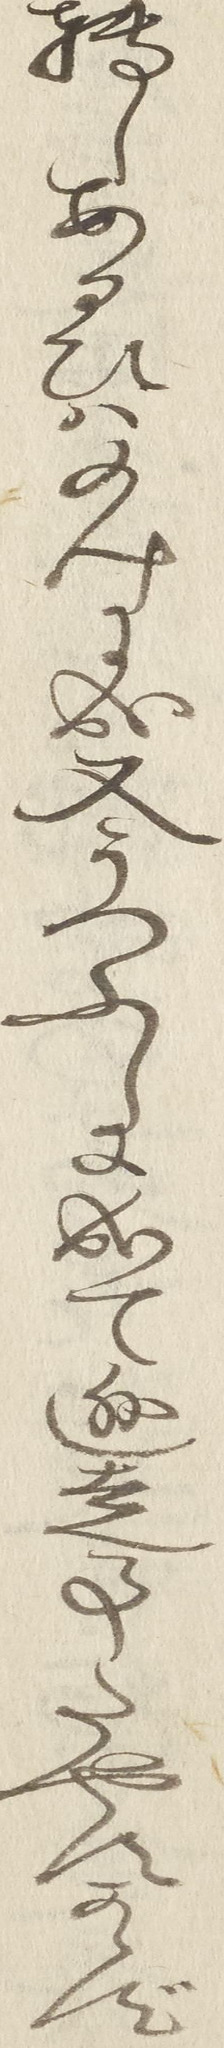転しあるひはのけに成又うつふしに成て逃走事たやすからず
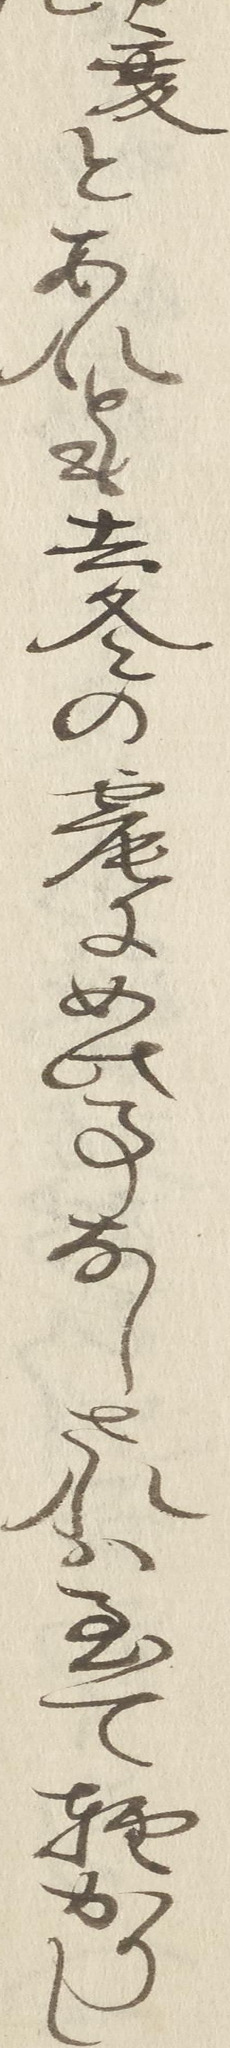万変記とあれとも去冬の震に如此事なしされは至て軽かりし
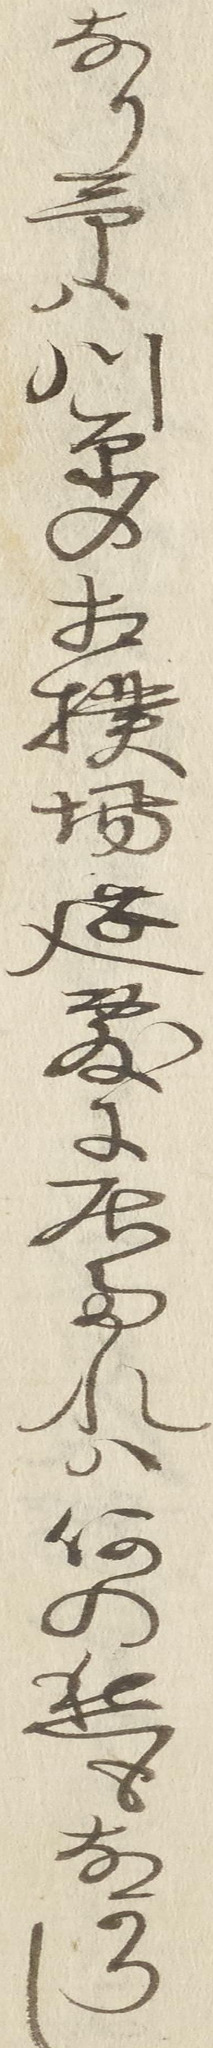なり予は川原の相撲場莚敷に居たれは何の愁もなかりし

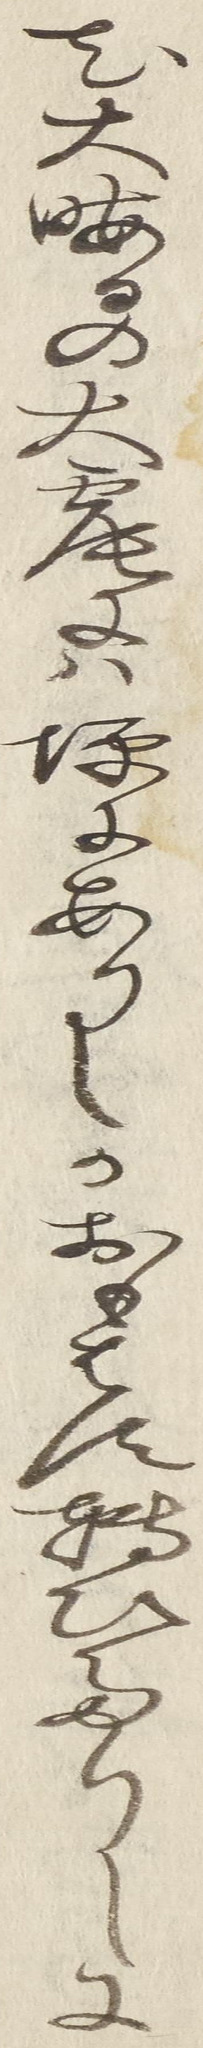尤大晦日の大震には隙にありしかおもはす転ひたりしに
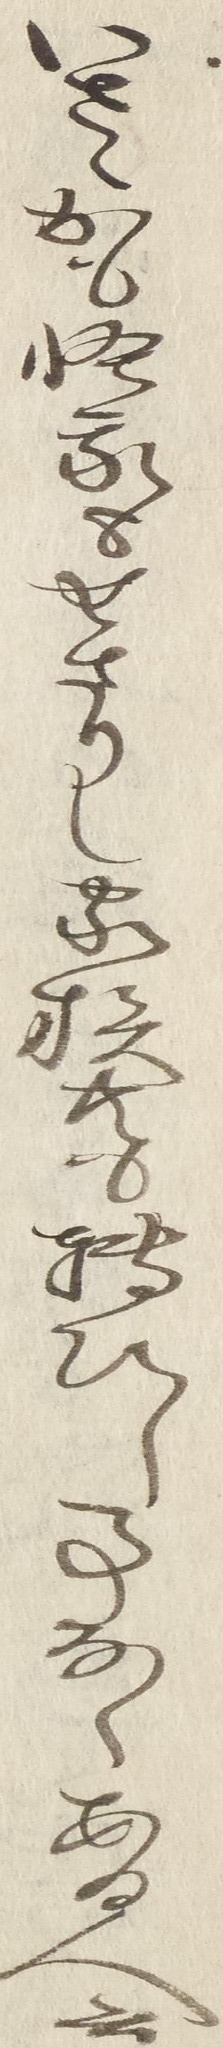いさゝかも怪我もせさりし家族共も転ひし事なくある人云
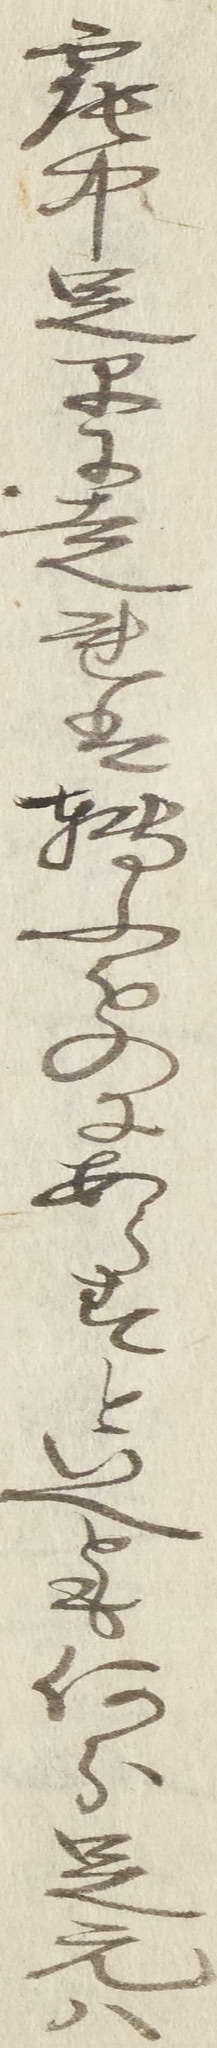震中足早に走れは転ふものにあらすといへとも何分足元は
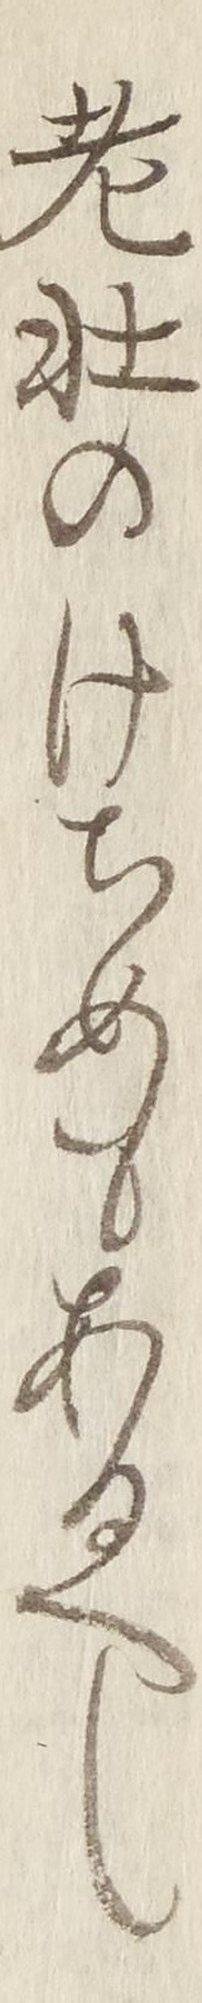老壮のけちめもあるへし
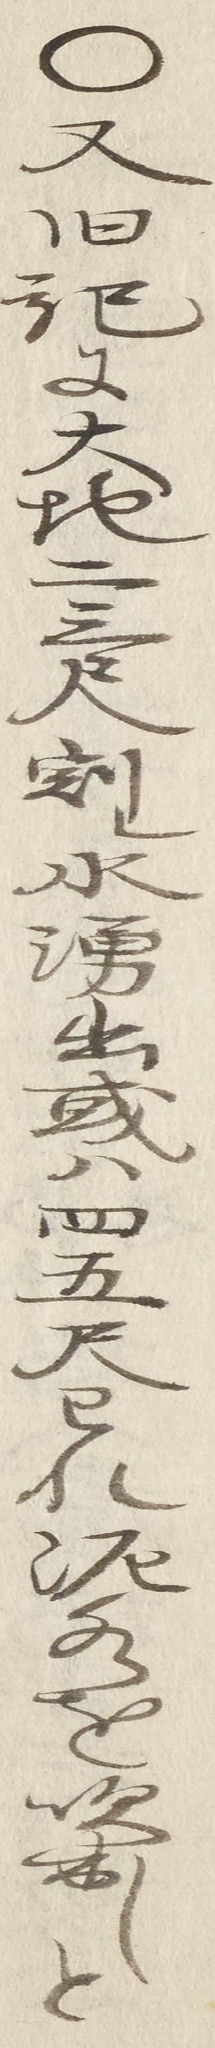○又旧記に大地二三尺割レ水湧出或ハ四五尺已れ泥水を吹出しと
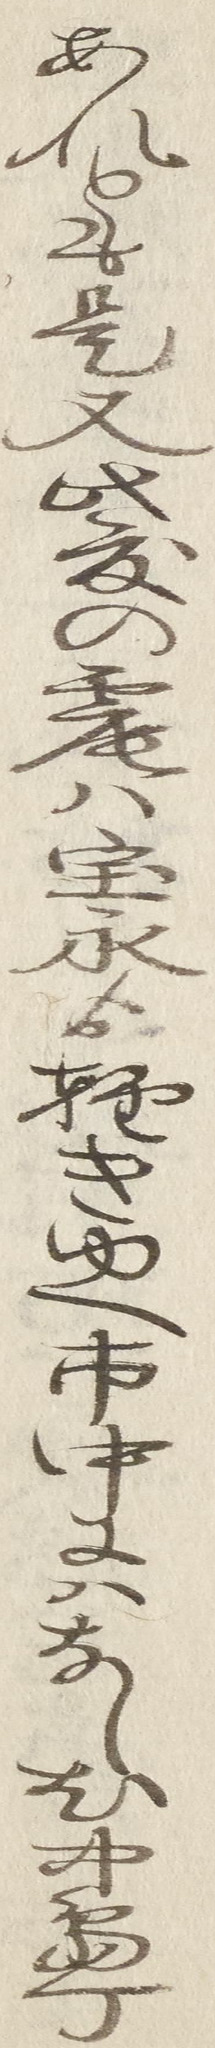あれとも是又此度の震は宝永ゟ軽きゆへ市中にハなし尤中島丁
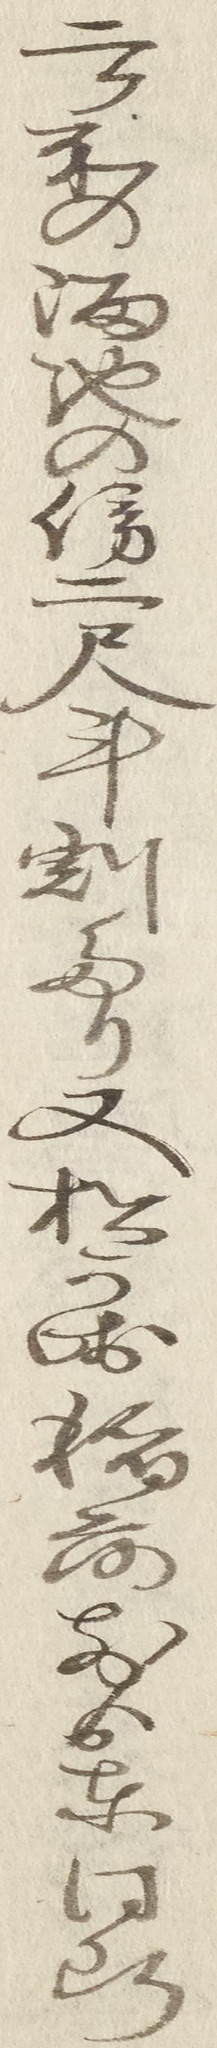二ヶ所の溜池の傍二尺計割たり又松か崎稲荷前ゟ東同断
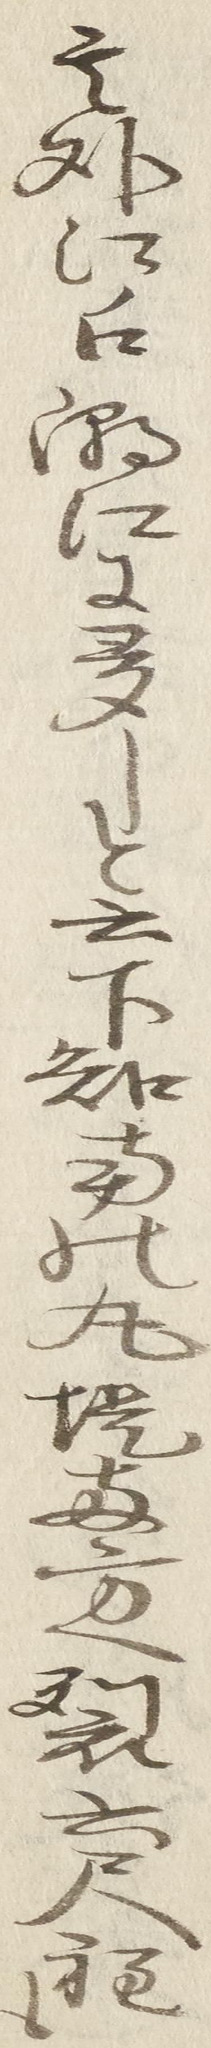其外に江ノ口潮江に多しと云下知南の丸堤両方へ裂六尺程も
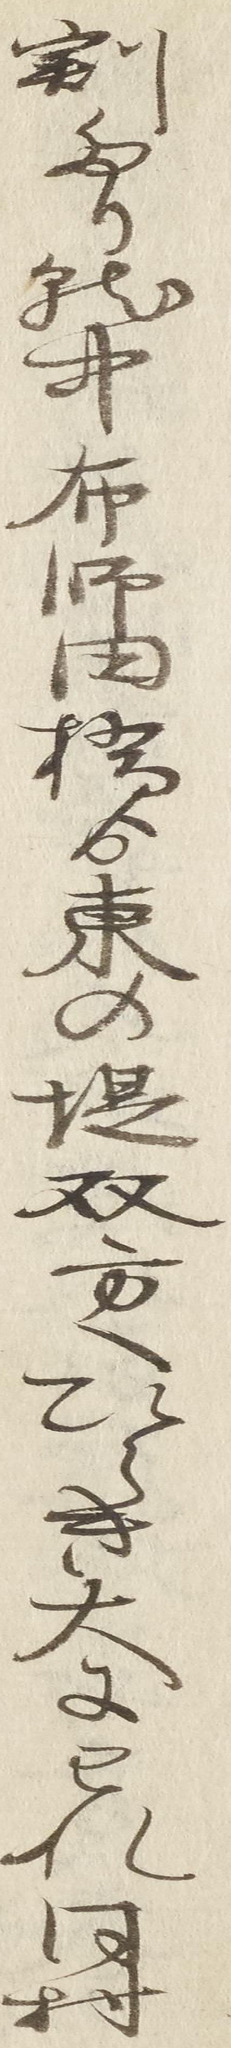割たり就中布師田橋ゟ東の堤双方へひらき大に已れ同村
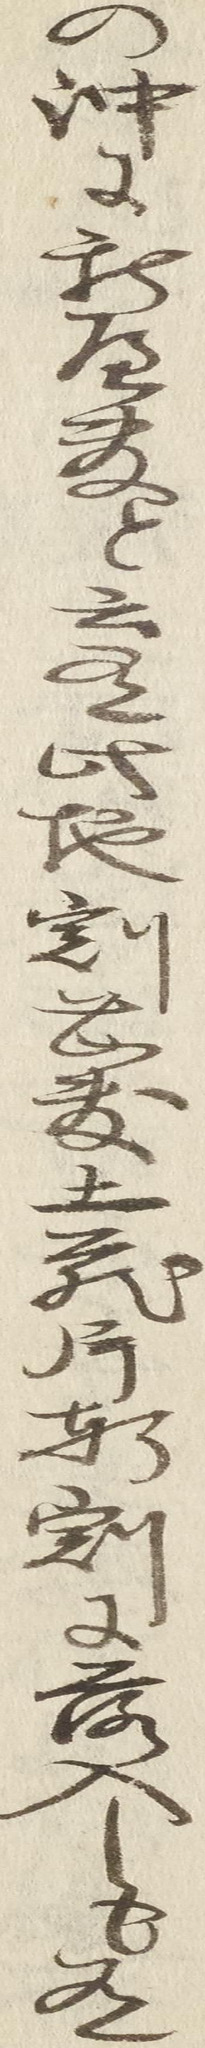の沖に新屋敷と云有此地割甚敷土蔵片軒割に落入しも有
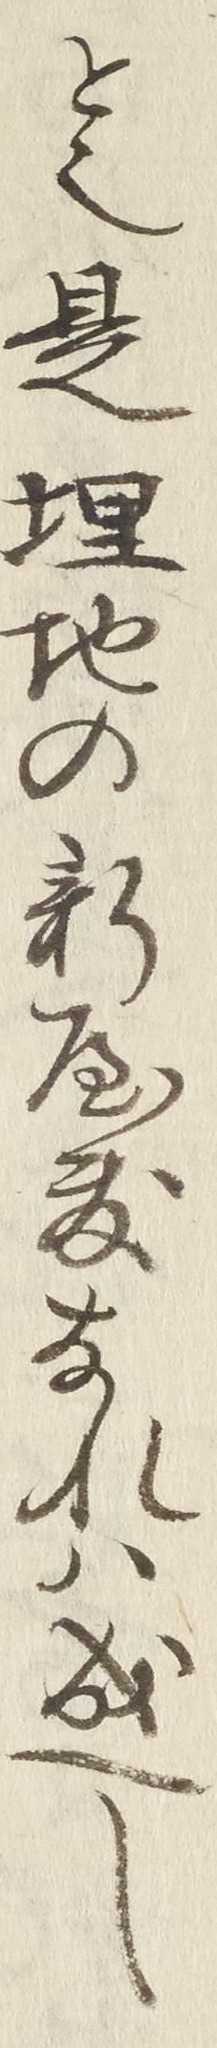と也是埋地の新屋敷なれハ成へし
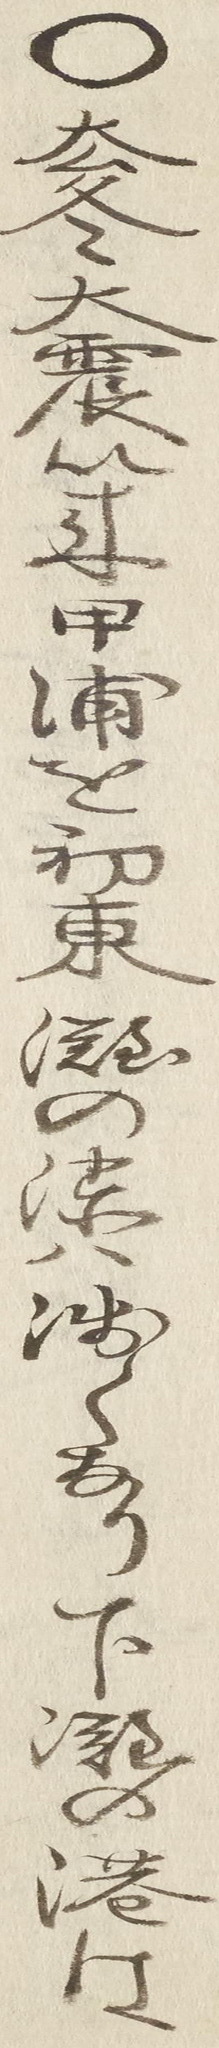○去冬大震以来甲浦を初東灘の湊ハ浅くなり下灘の港は
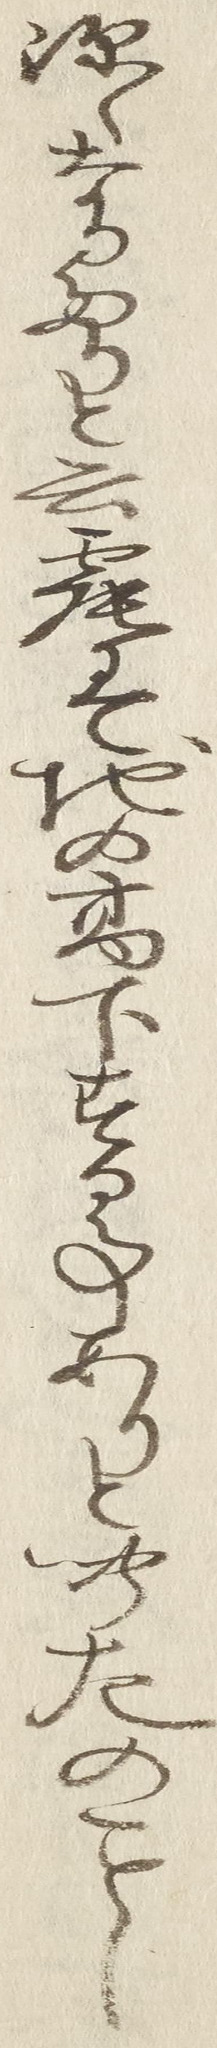深くなりたりと云震にて地の高下する事ありと聞左のことし
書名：地震記　上
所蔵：東京大学地震研究所図書室 Earthquake Research Institute Library, The University of Tokyo, JAPAN
